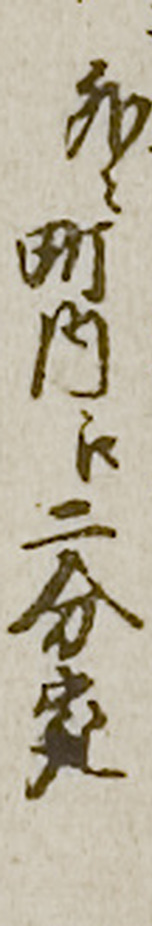外に町内江二分宛
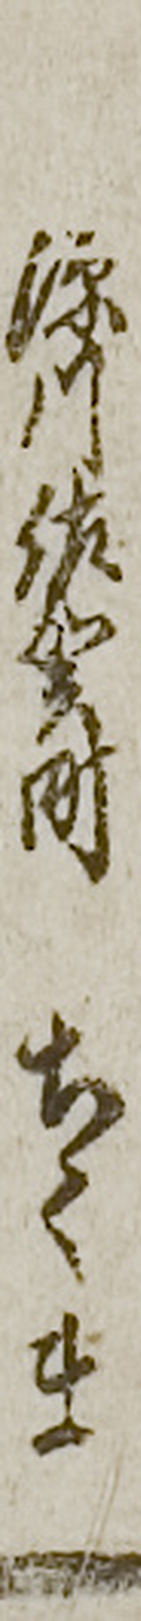深川佐賀町ちくま
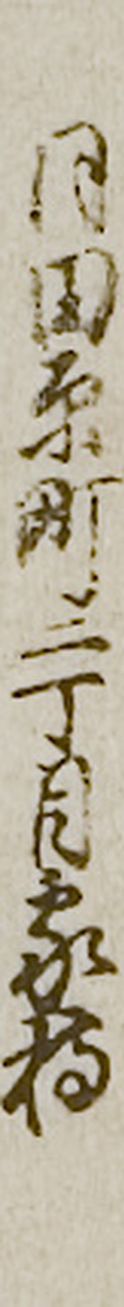同田原町二丁目家持
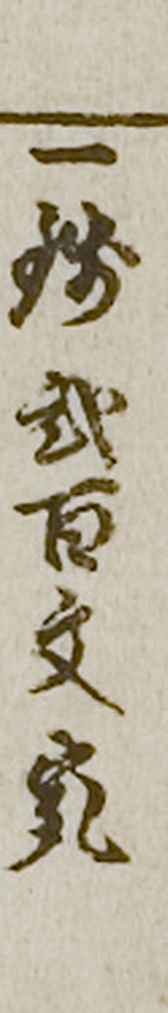一銭弐百文宛某
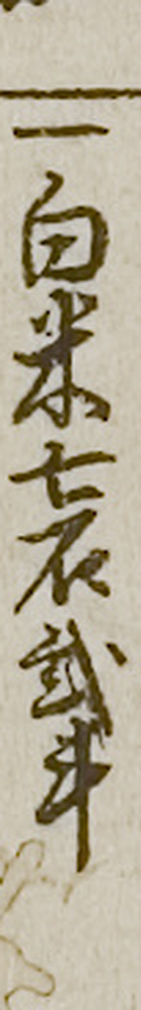一白米七石弐斗
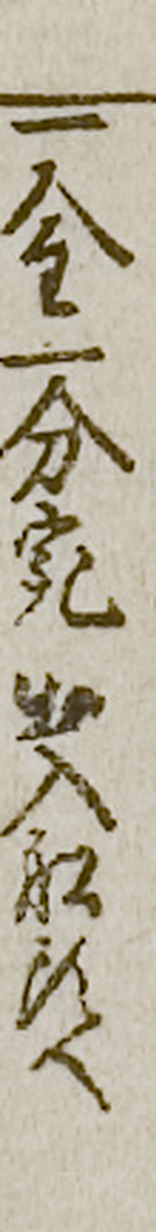一金一分宛出入船頭へ
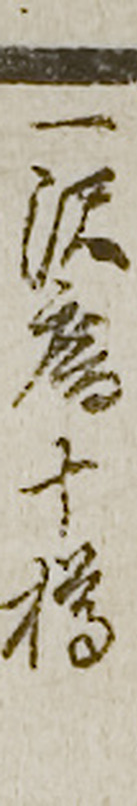一沢庵十樽
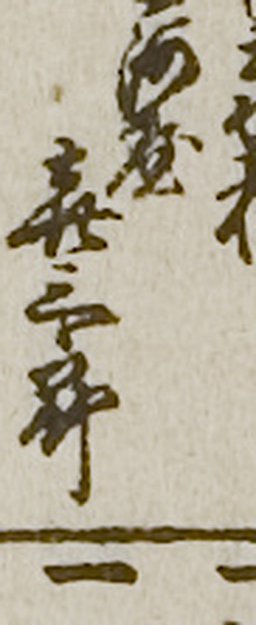喜三郎
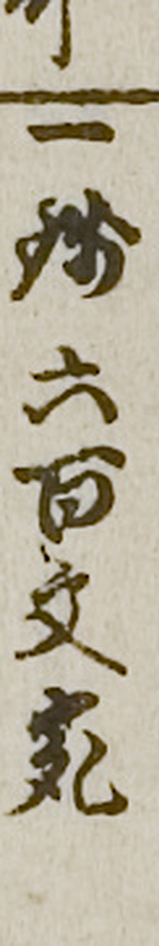一銭六百文宛
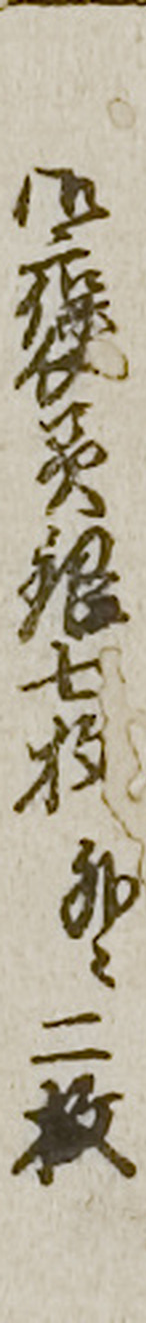御褒美銀七枚外に二枚
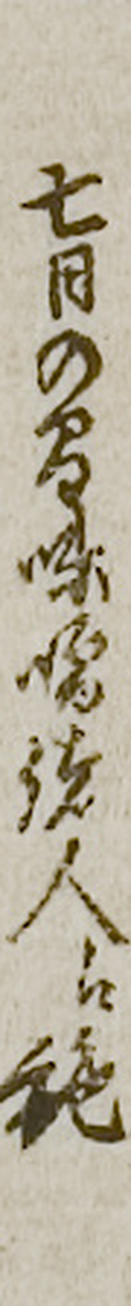七日の間味噌諸人江施
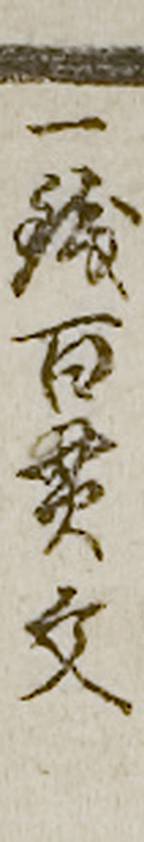一銭百貫文
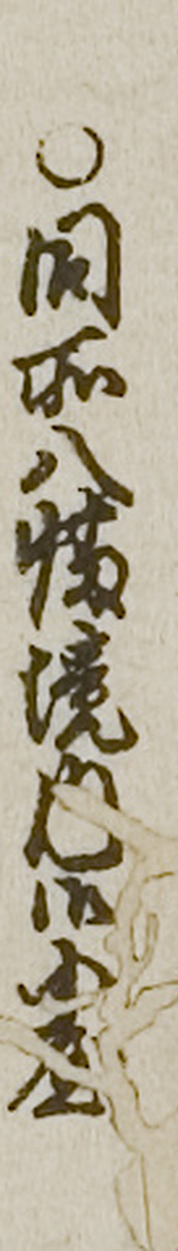○同所八幡境内御小屋
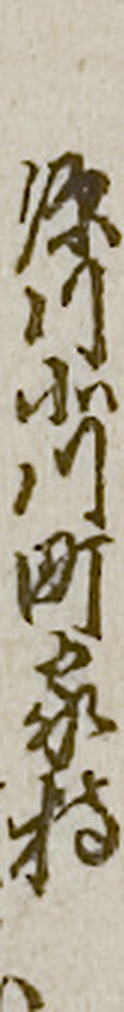深川北川町家持
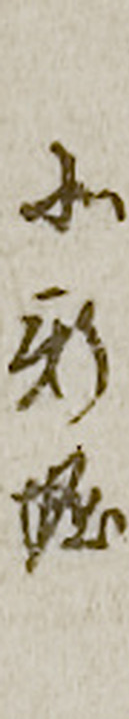南新堀
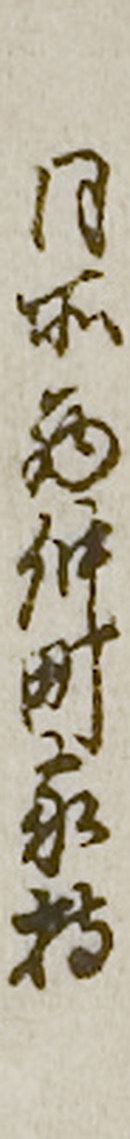同所西仲町家持
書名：地震出火御救小屋施行名前附
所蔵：東京大学総合図書館 General Library in the University of Tokyo, JAPAN
